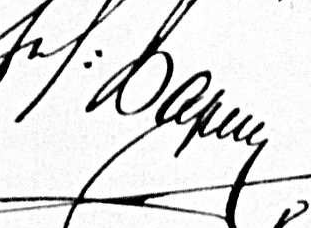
xx
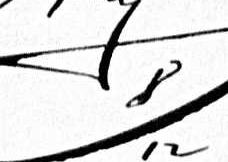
8
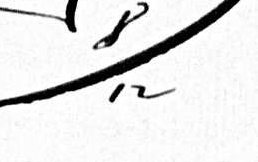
12
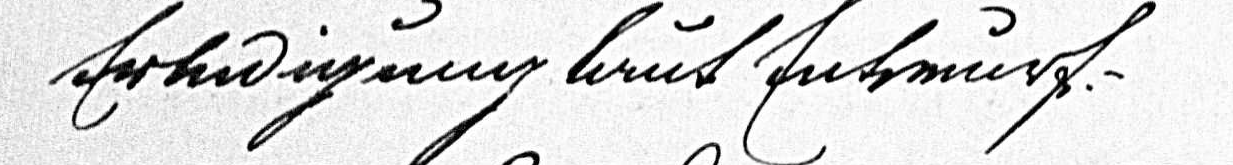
Erledigung laut Entwurf.-
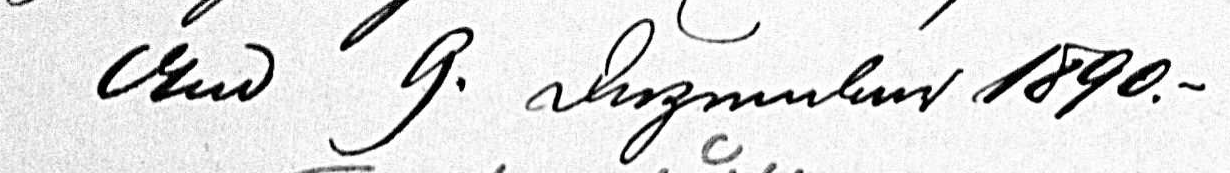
Am 9. Dezember 1890.-
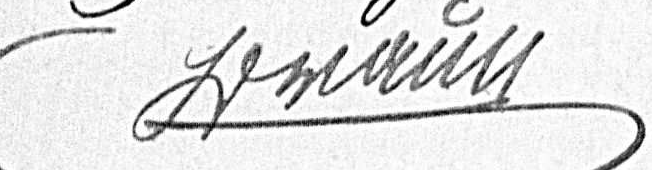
Braun
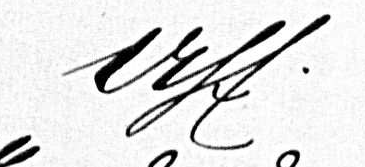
AhE.
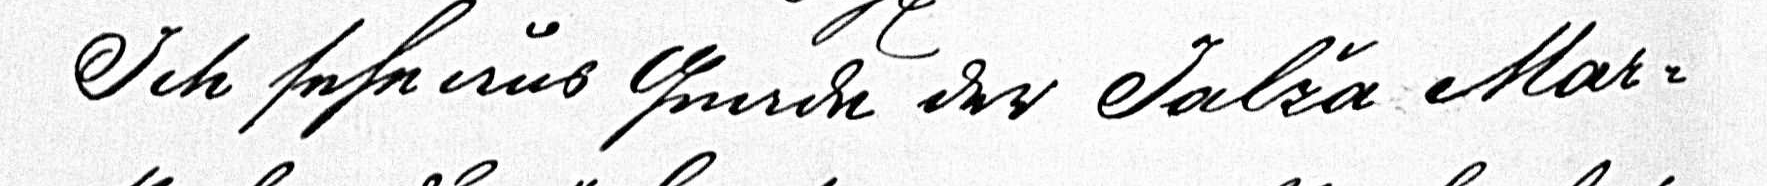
Jch sehe aus Gnade der Jalža Mar¬
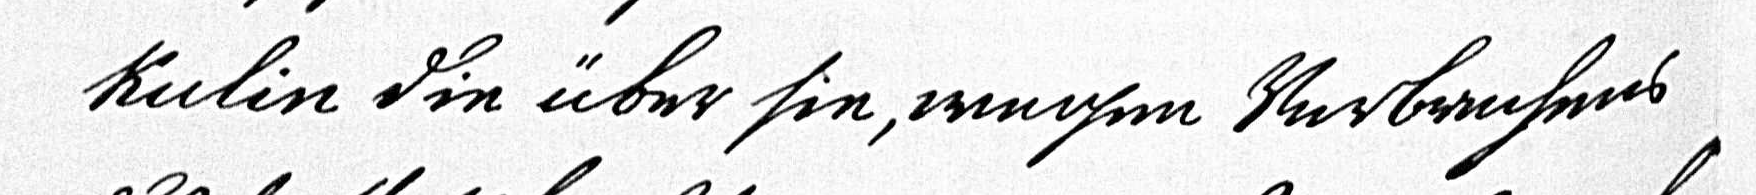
kulin die über sie, wegen Verbrechens
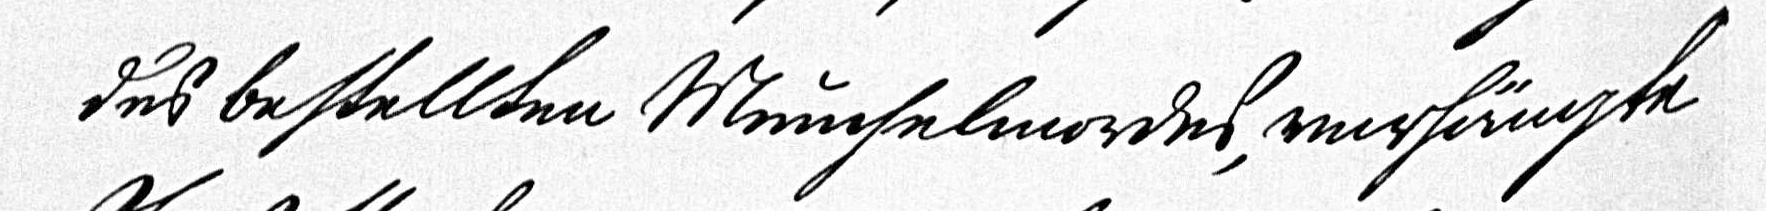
des bestellten Meuchelmordes, verhängte
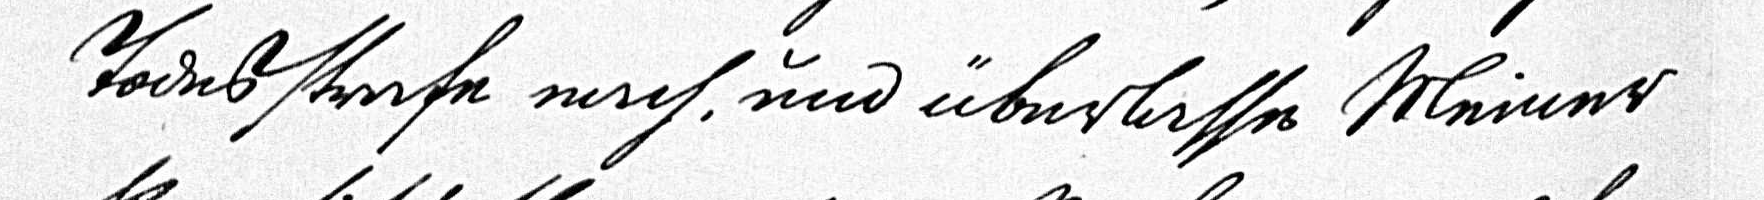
Todesstrafe nach, und überlasse Meiner
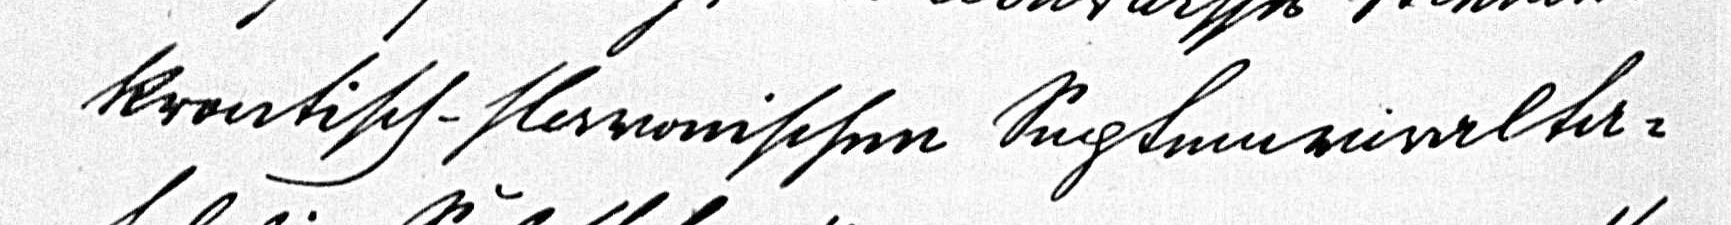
kroatisch-slavonischen Septemviarlta¬
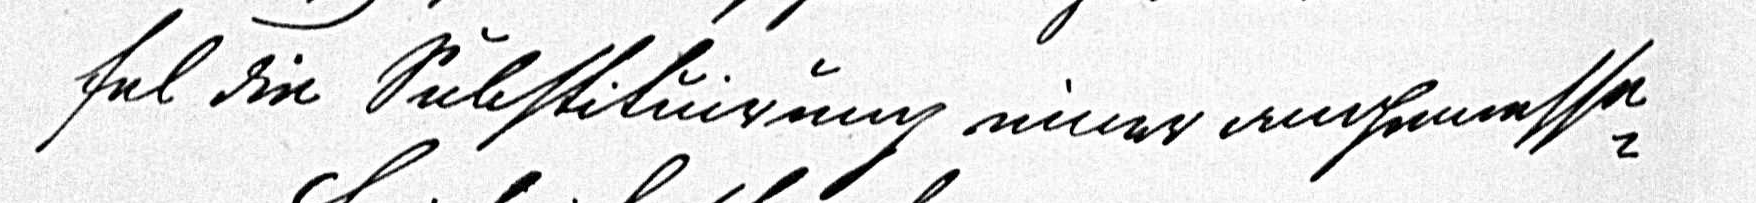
fel die Substituirung einer angemesse¬
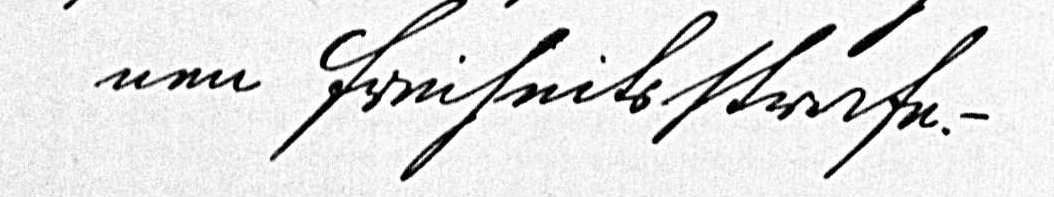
nen Freiheitsstrafe.-
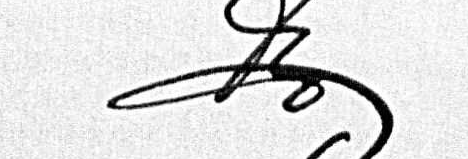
xx
